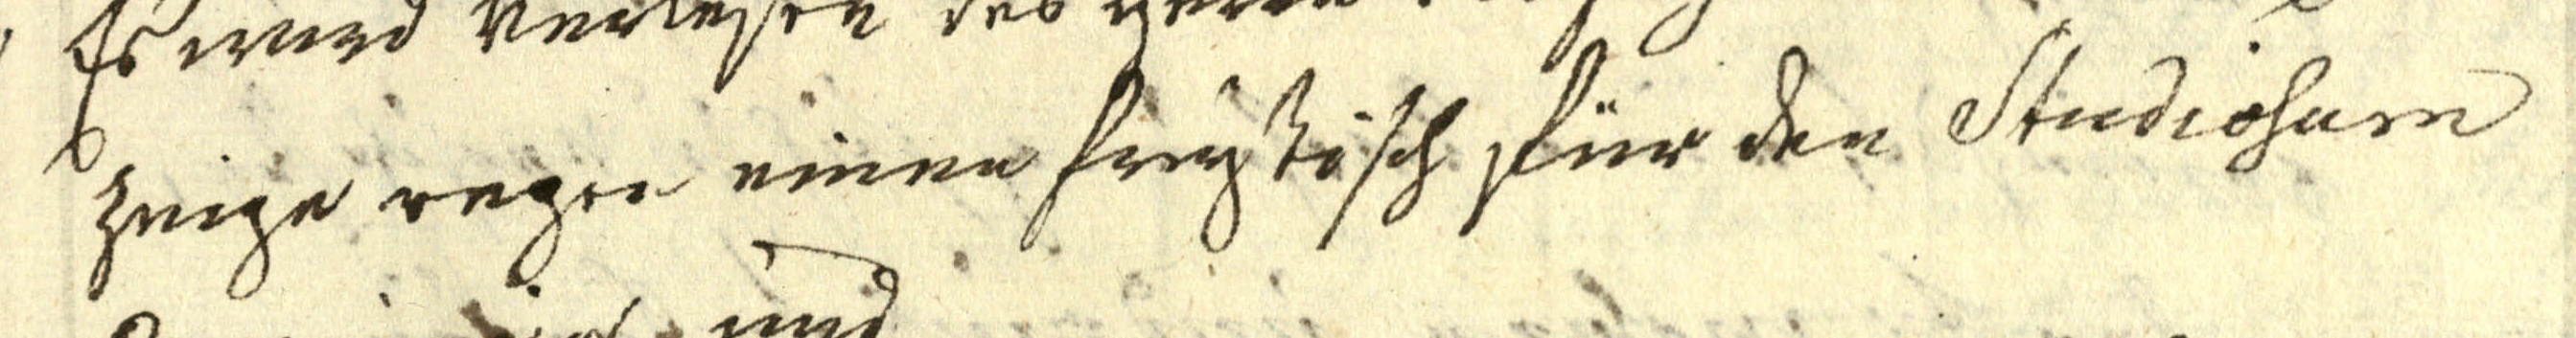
zeige wegen einen freÿtisch für den Studiosum
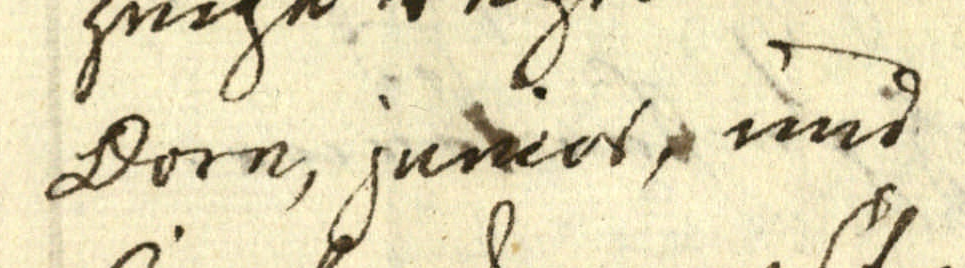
Dorn, junior, und
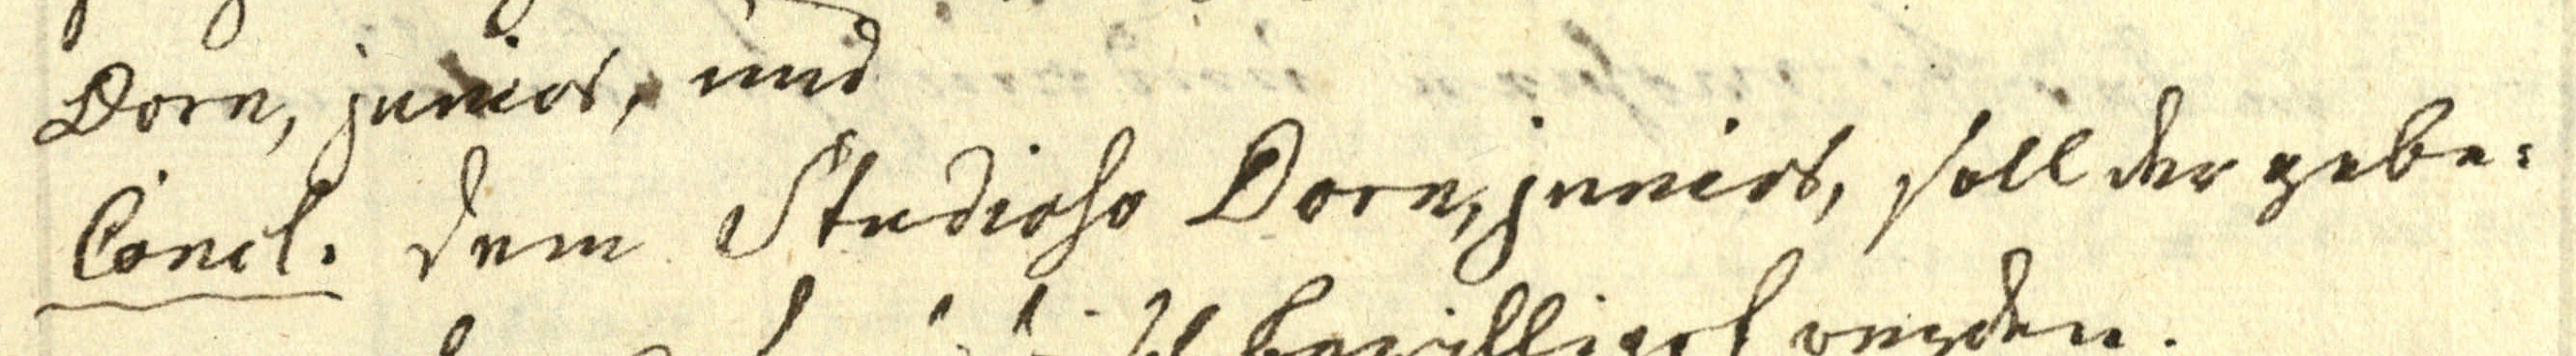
Concl. dem Studioso Dorn, junior, soll der gebe¬
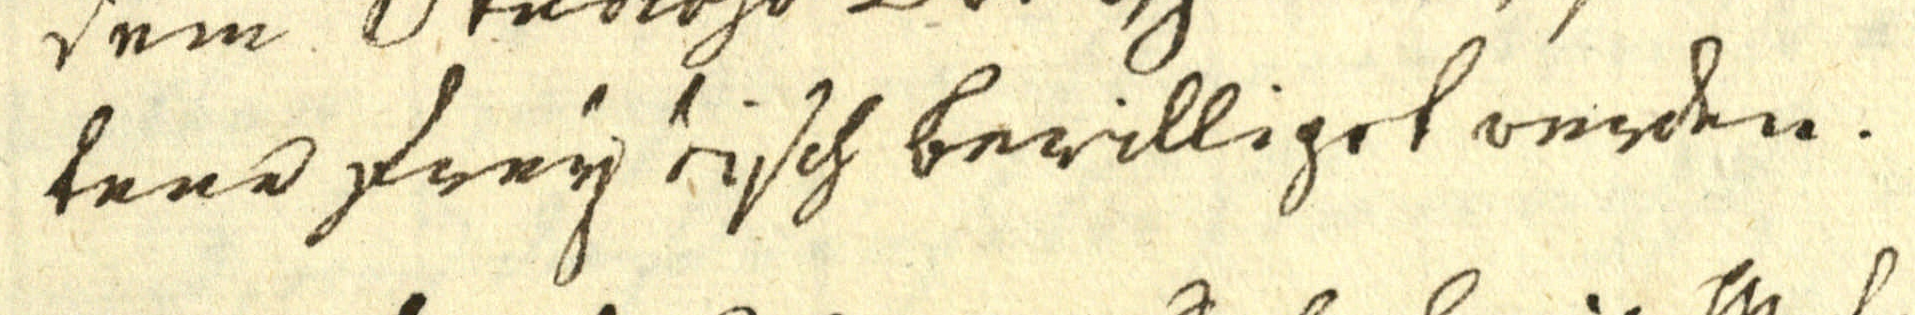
tene freÿtisch bewilliget werden.
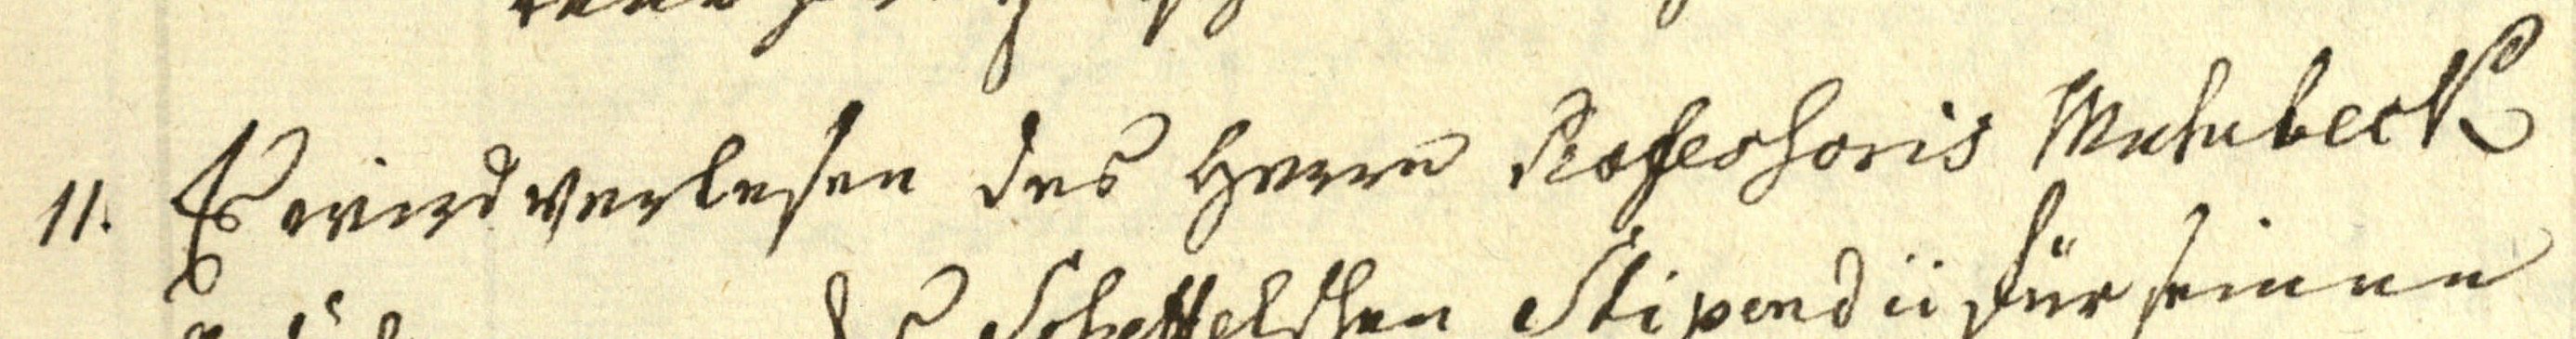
11. Es wird verlesen des Herrn Professoris Muhrbeck
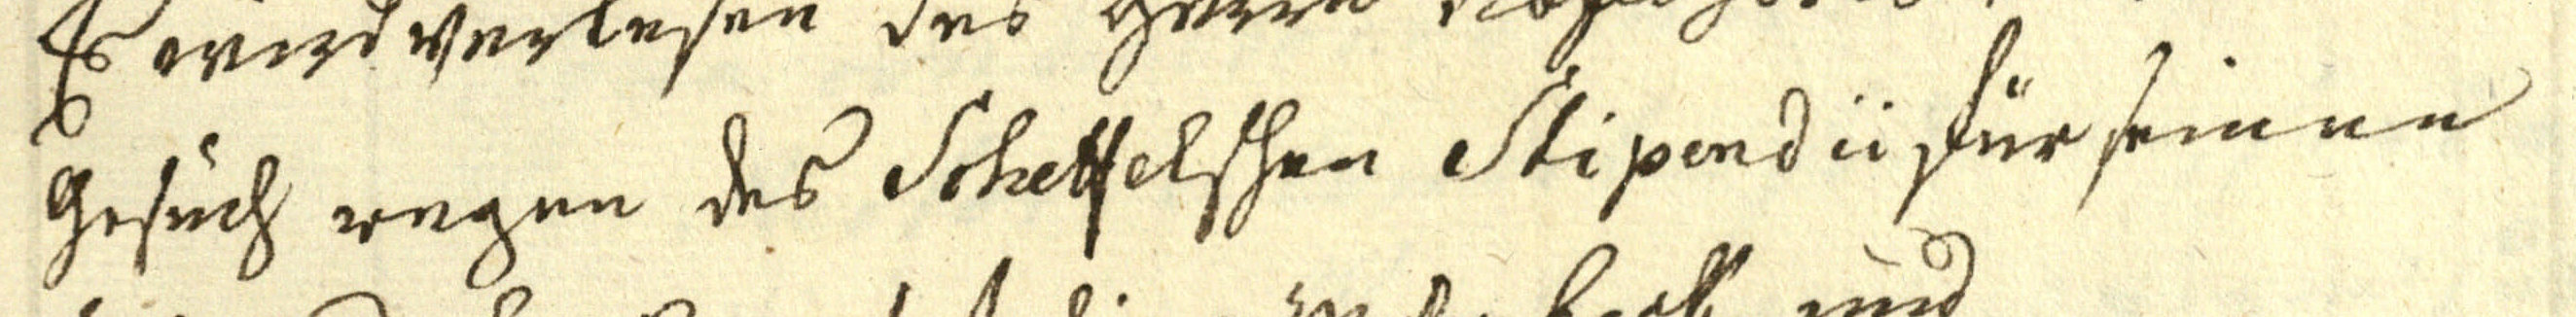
Gesuch wegen des Scheffelschen Stipendii für seinen
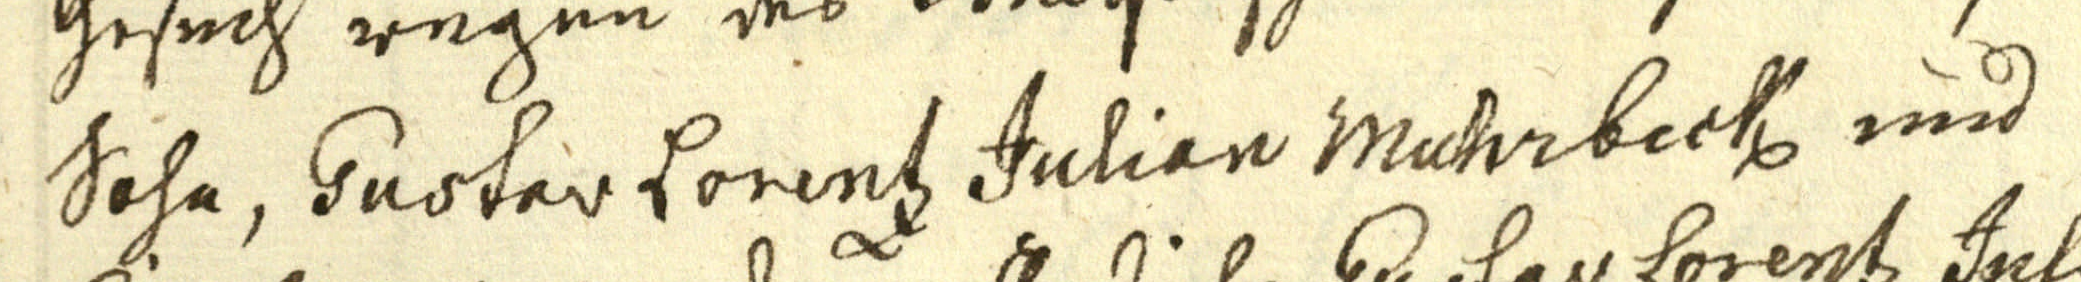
Sohn, Gustav Lorentz Julian Muhrbeck und
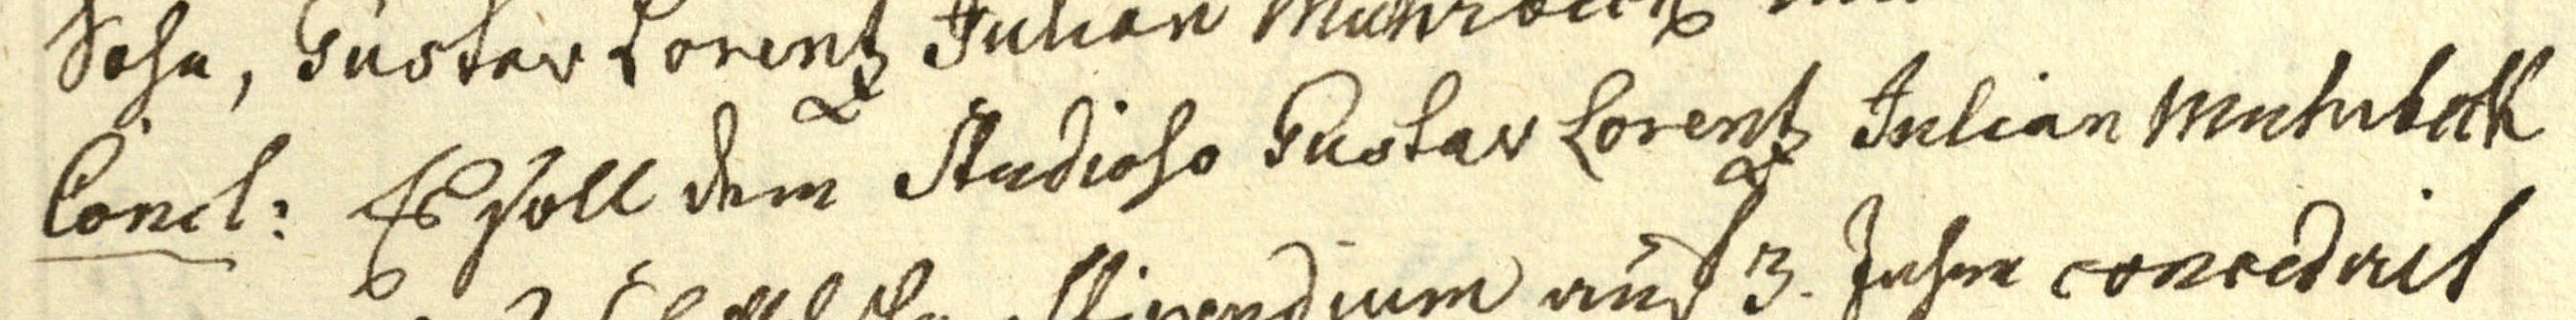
Concl. Es soll dem Studioso Gustav Lorentz Julius Muhrbeck
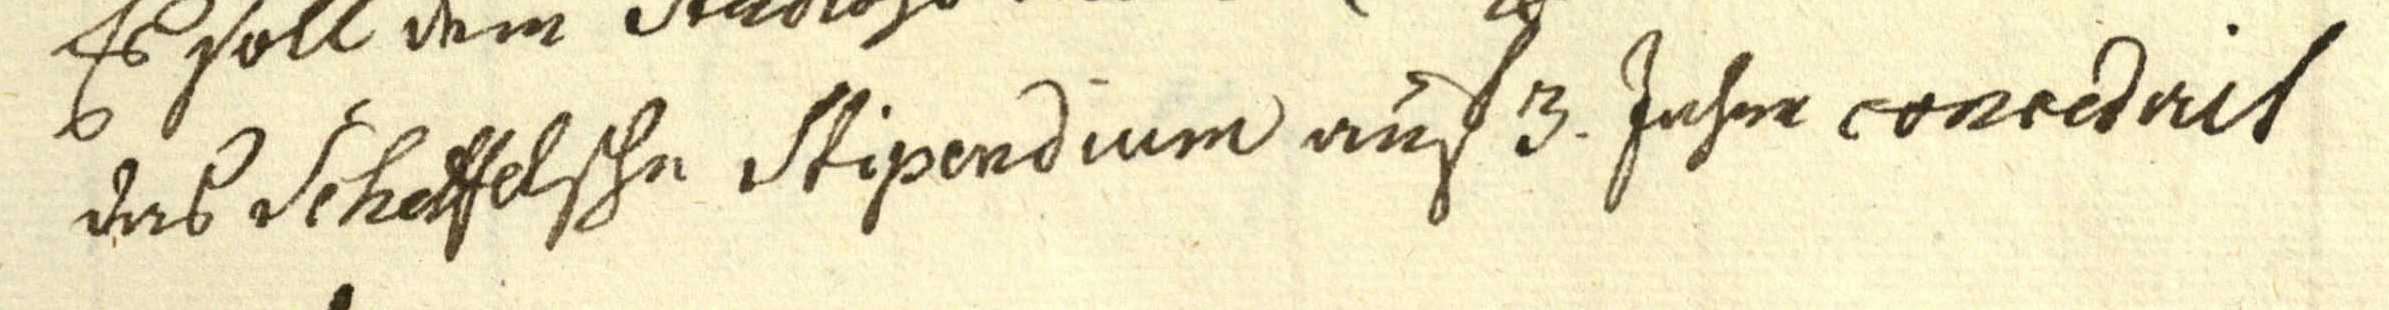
das Scheffelsche Stipendium auf 3 Jahre concediret
